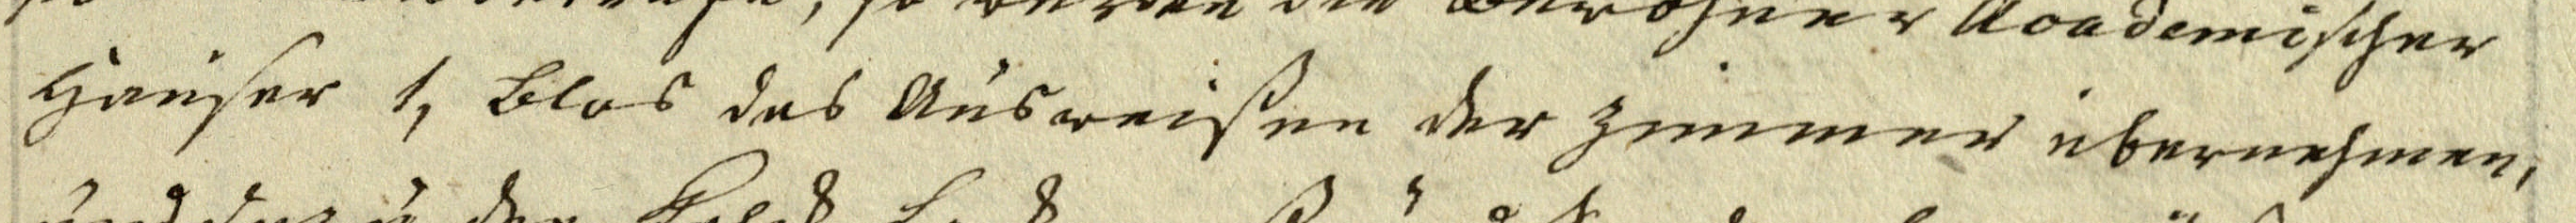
Häuser 1, blos das Ausweißen der Zimmer übernehmen,
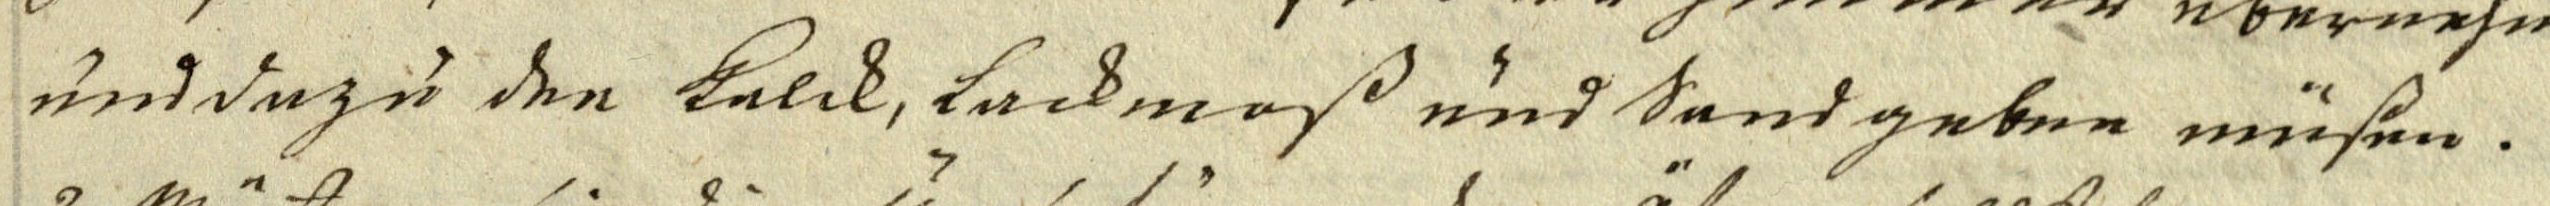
und dazu den Kalck, Lackmoß und Sand geben müßen.
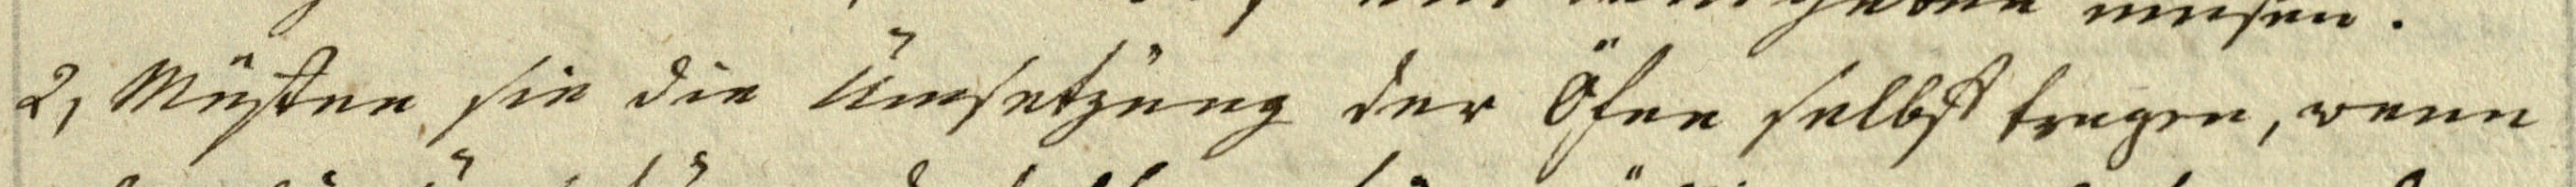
2, Müsten sie die Umsetzung der Öfen selbst tragen, wenn
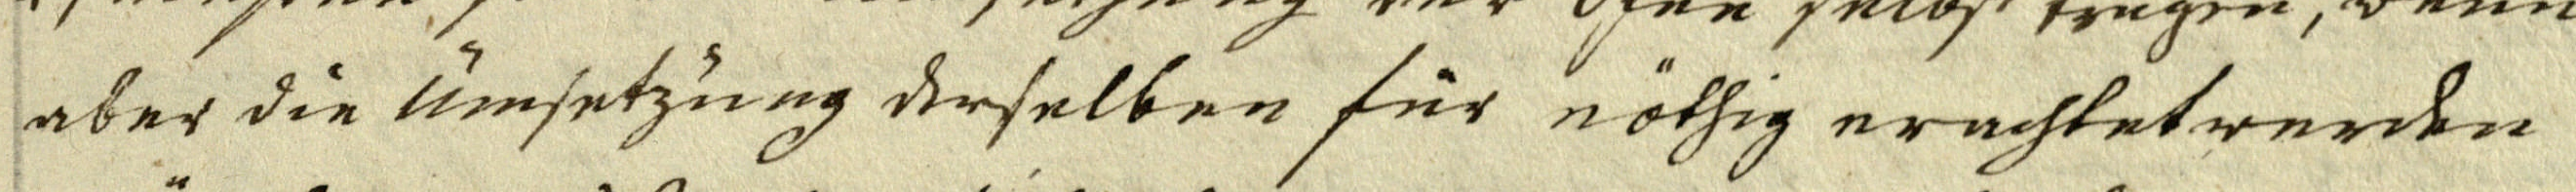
aber die Umsetzung derselben für nöthig erachtet werden
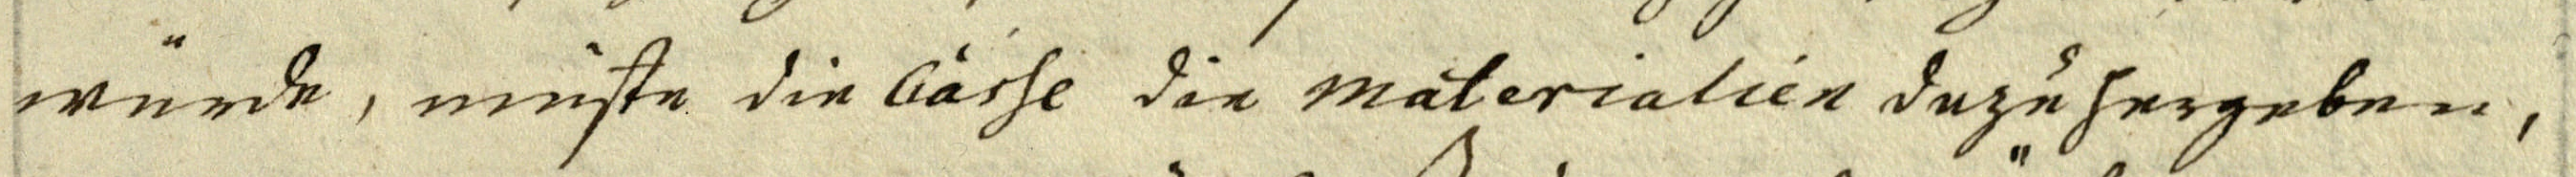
würde, müste die Casse die Materialien dazu hergeben,
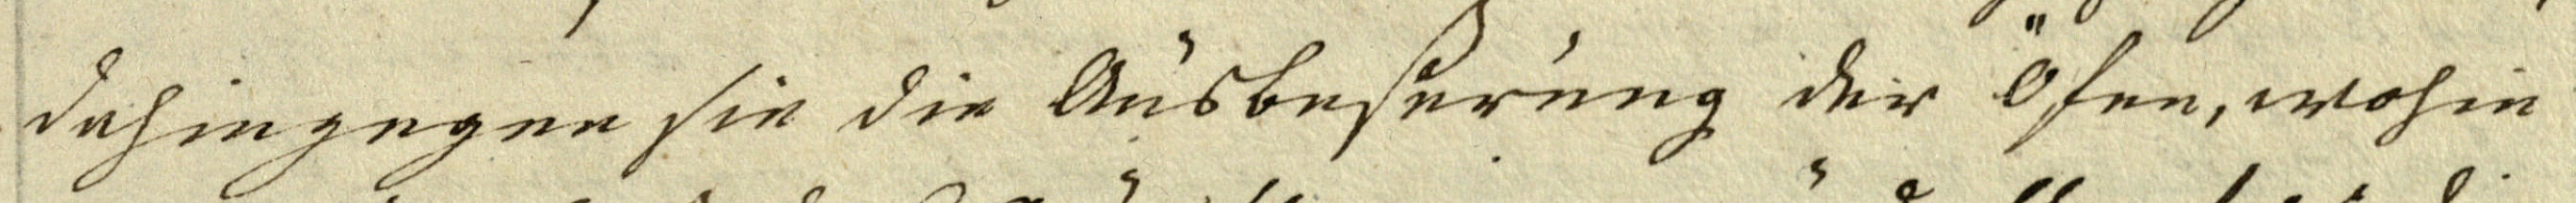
dahingegen sie die Ausbeßerung der Öfen, wohin
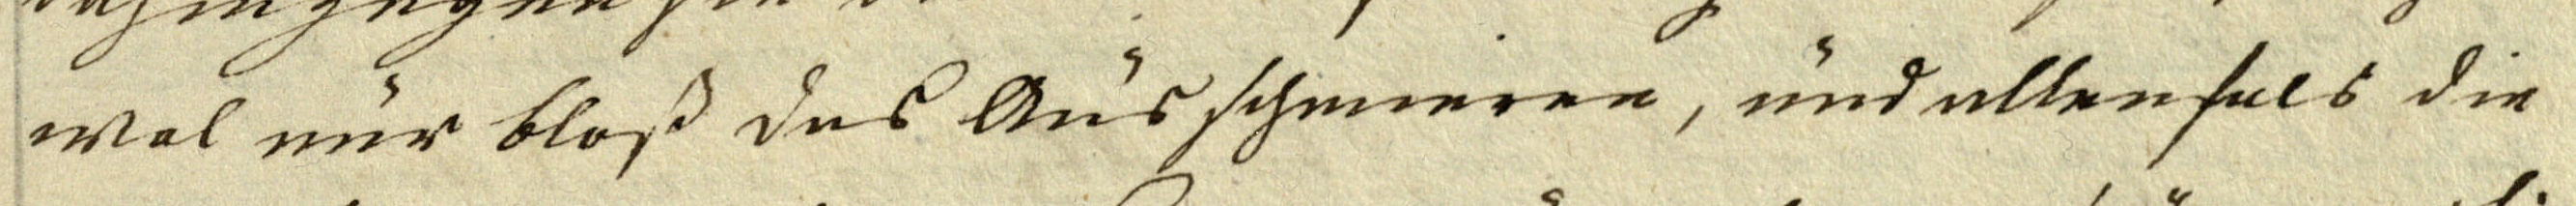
wol nur bloß das Ausschmieren, und allenfals die
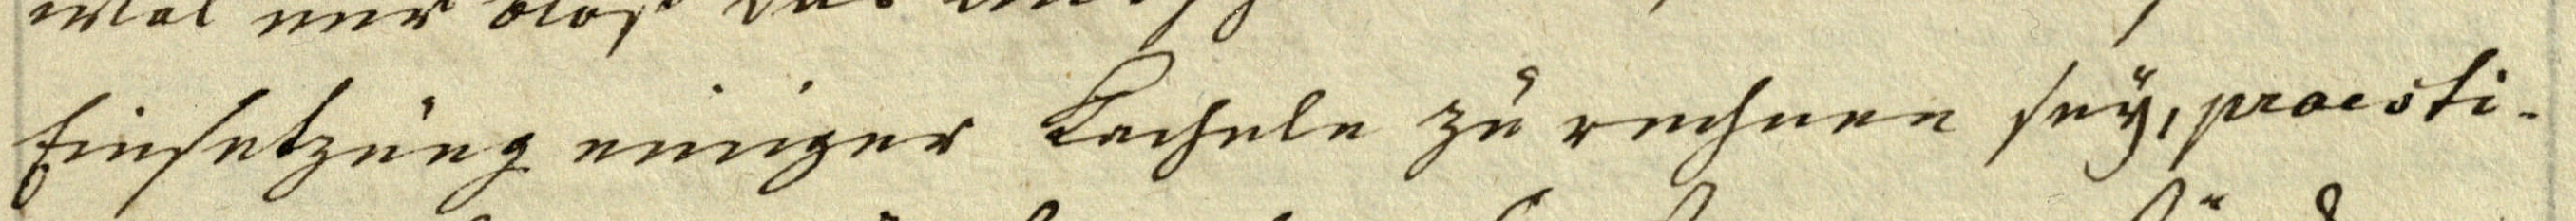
Einsetzung einiger Kacheln zu rechnen seÿ, praesti¬
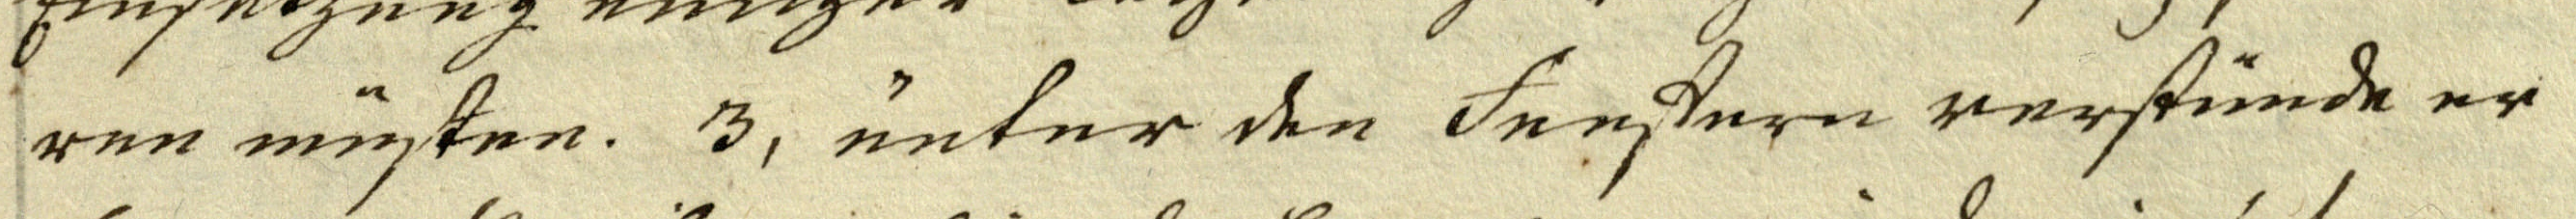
ren müsten. 3, unter den Fenstern verstünde er
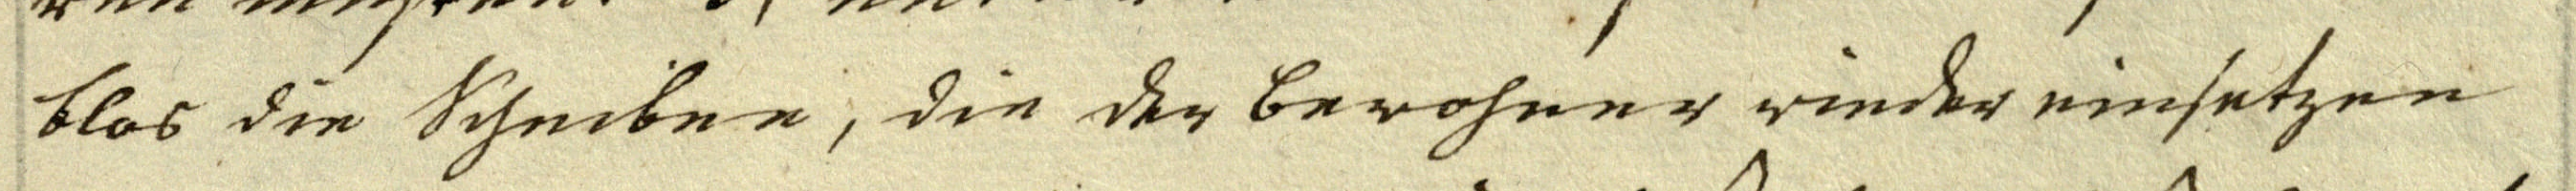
blos die Scheiben, die der Bewohner wieder einsetzen
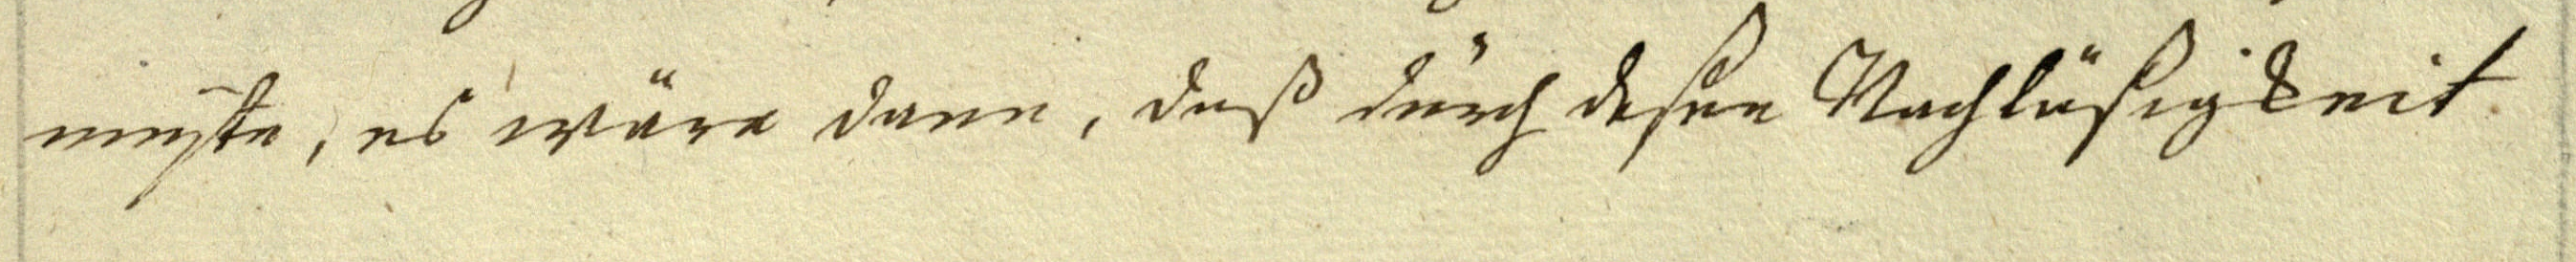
müste, es wäre dann, daß durch deßen Nachläßigkeit
